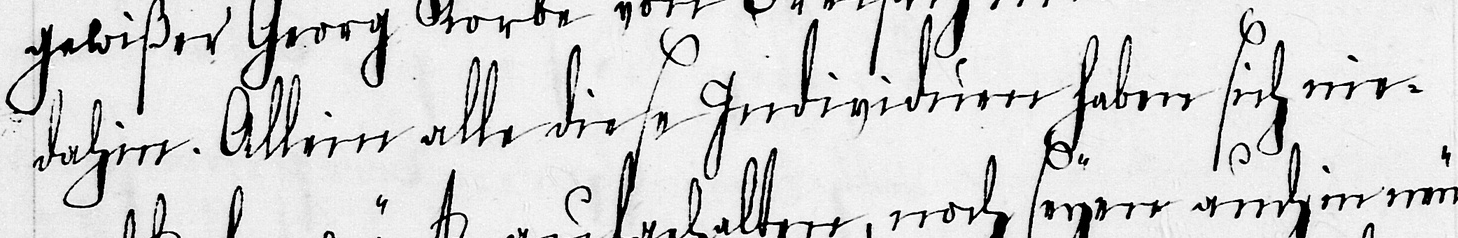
dahin. Allein alle diese Individuen haben sich nie¬
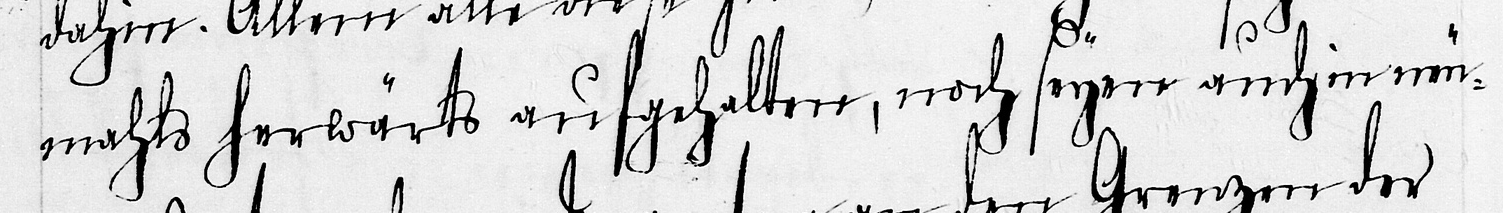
mahls herwärts aufgehalten, noch seyen auch in neu¬
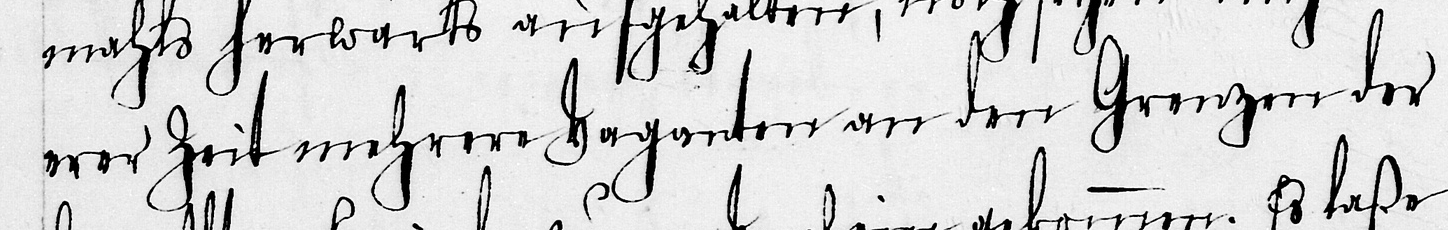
erer Zeit mehrere Vaganten an den Grenzen der
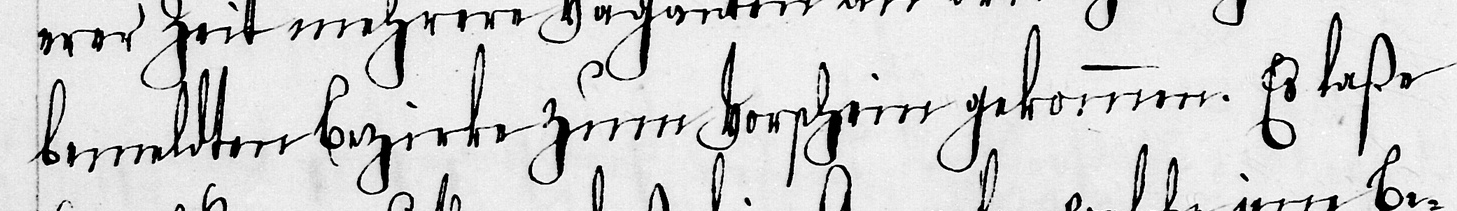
bemeldten Bezirke zum Vorschein gekommen. Es laße
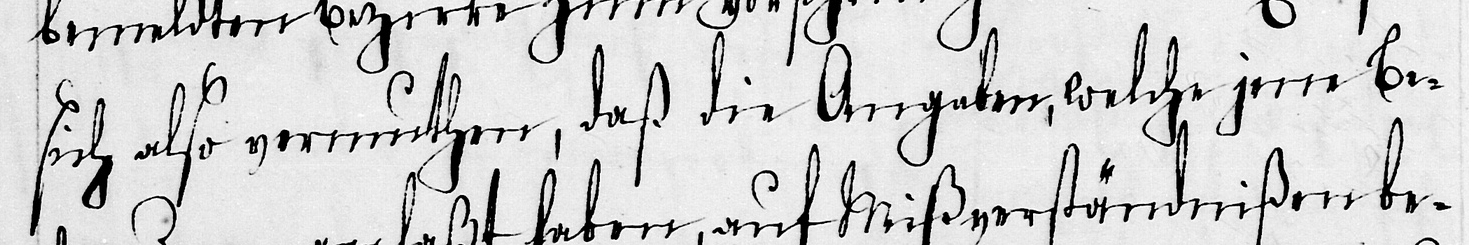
sich also vermuthen, daß die Angaben, welche jene Be¬
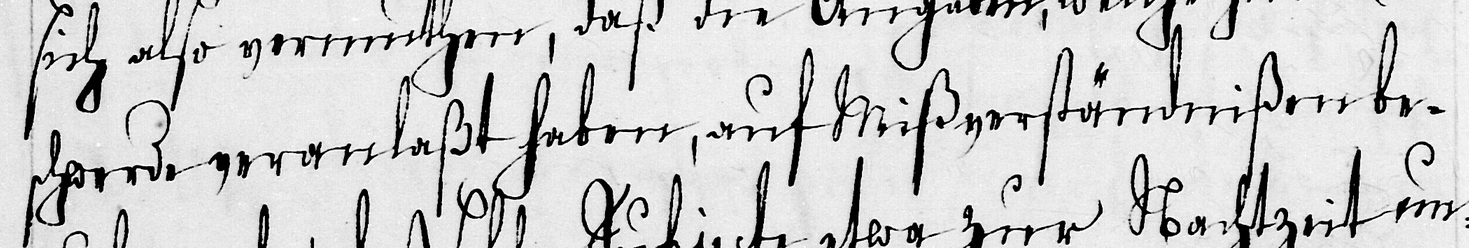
schwerde veranlaßt haben, auf Mißverständnißen be¬
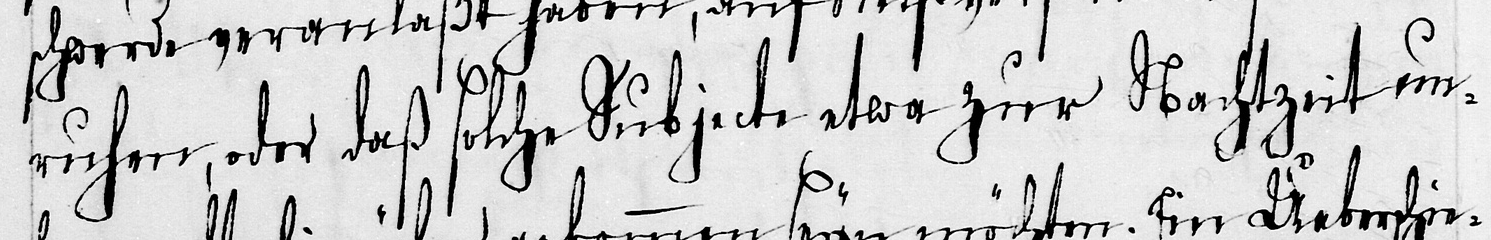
ruhen, oder daß solche Subjecte etwa zur Nachtzeit un¬
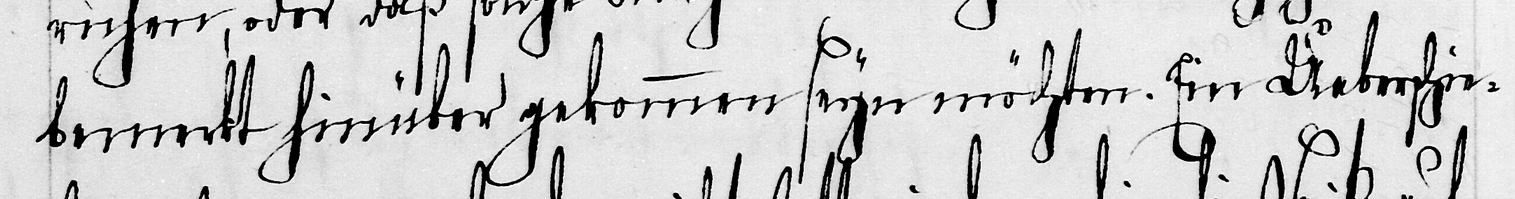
bemerkt hinüber gekommen seyn möchten. Ein Ueberschi¬
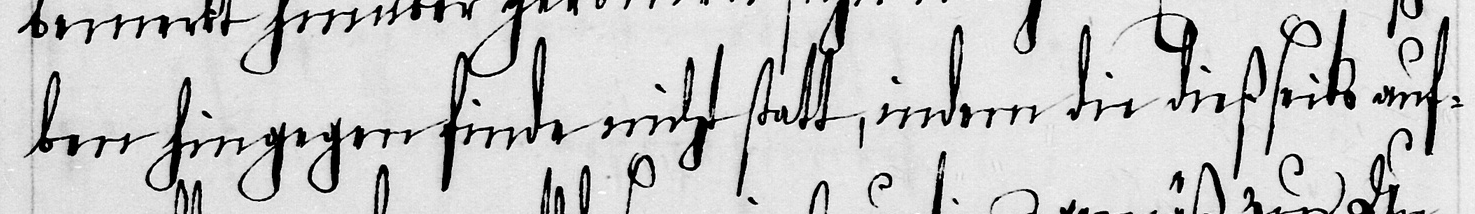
ben hingegen finde nicht statt, indem die dießseits
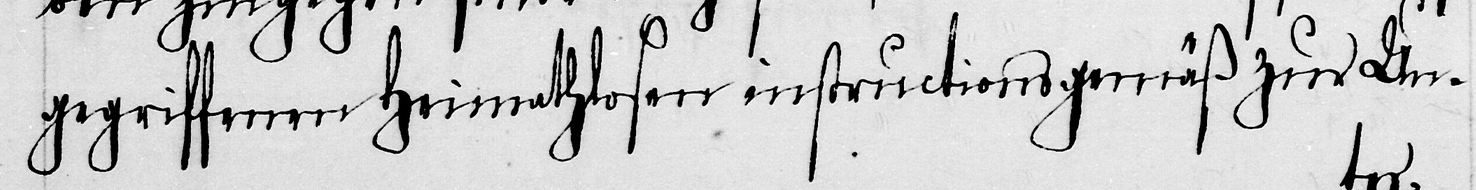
gegriffenen Heimathlosen instructionsgemäß zur Un-
